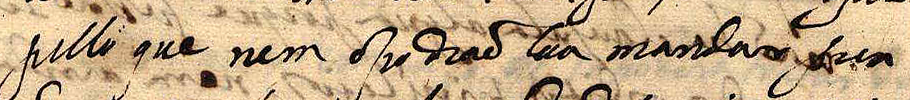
pello que nem o podiaõ laa mandar pren
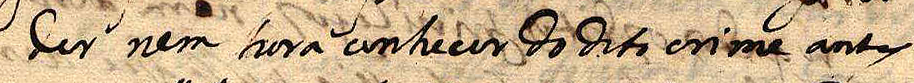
der nem hora conhecer do dito crime antes
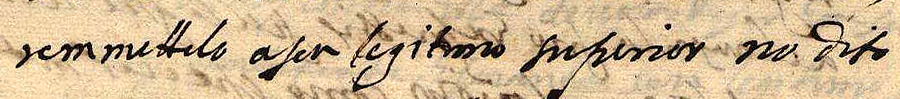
remmettelo a seu legitimo superior no dito
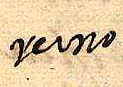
reino
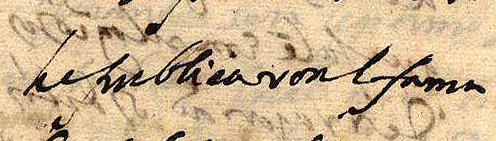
he publicaron fama
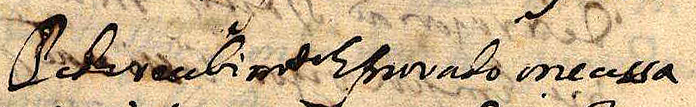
Pede recebim.to E provado o necessa
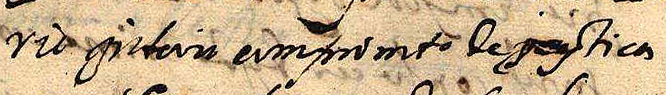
rio jnteiro compromto de justiça
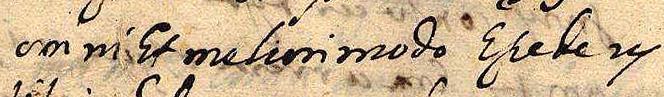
omni Et meliori modo E pede res
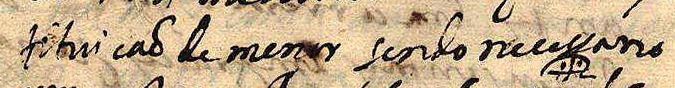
tituiçaõ de menor sendo necessario
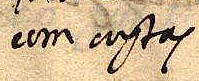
com custas
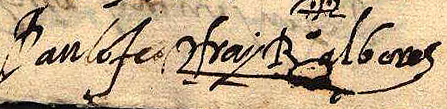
Paulo fez fray Ro albores
